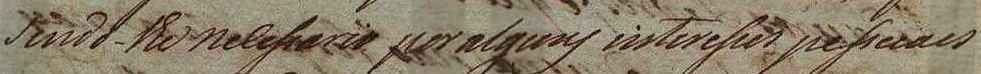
sendo-lhe necessario, por alguns interesses pessuaes
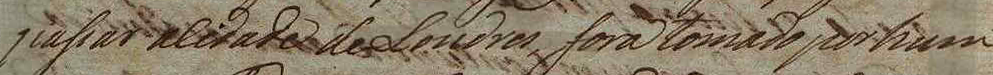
passar a cidade de Londres, fora tomado por hum
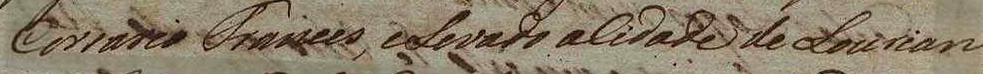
corsario Frances, e Levado a Cidade de Lourian
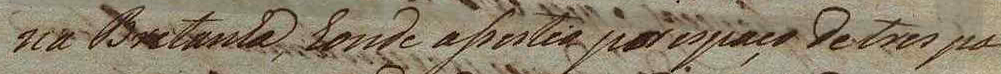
na Bretanha, honde assestio por espaço de tres pa
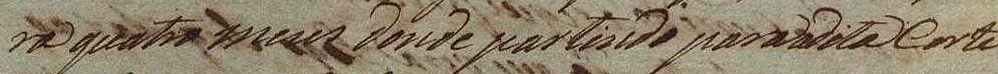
ra quatro mezes donde partindo para a dita Corte
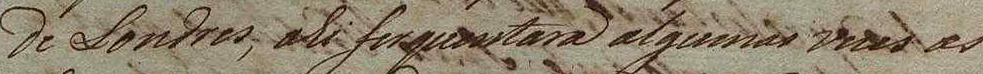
de Londres, ahi ferquentara algumas vezes as
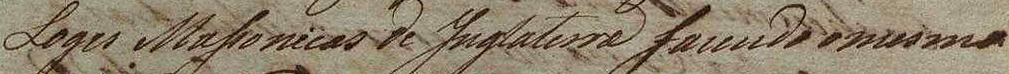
Loges Massonicas de Jnglaterra fazendo o mesmo
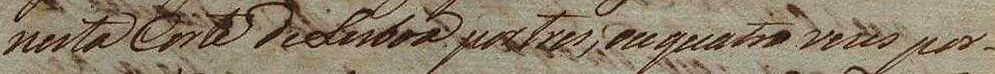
nesta Corte de Lisboa por tres, ou quatro vezes por
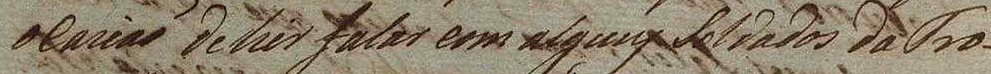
oCaziaõ de hir falar com alguns Soldados da Tro
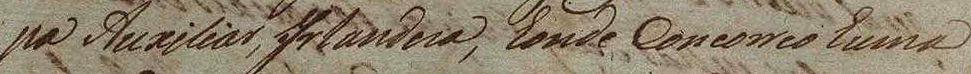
pa Auxiliar, Jrlandeza, honde Concorreo huma
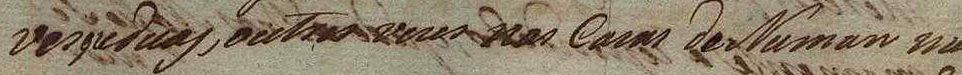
ves, ou duas, outras vezes nas Cazas de Numan mo
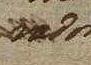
rador
